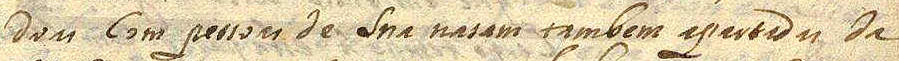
doas Com pessoas de Sua nasam tambem apartadas da
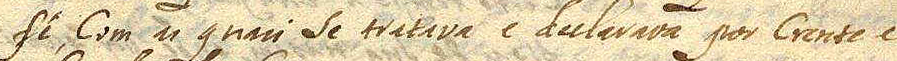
fé, Com as quais se tratava e declarava por Crente e
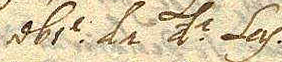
obse. da da. Ley.
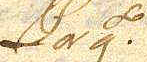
Porqto.
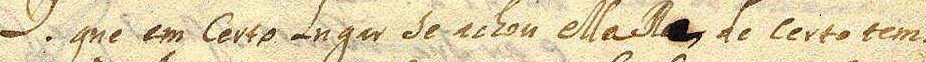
P. que em Certo Lugar se achou ella Re, de certo tem
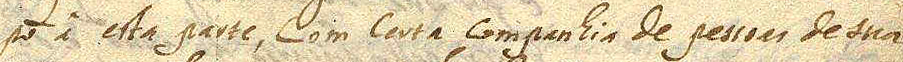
po â esta parte, Com Certa Companhia de pessoas de sua
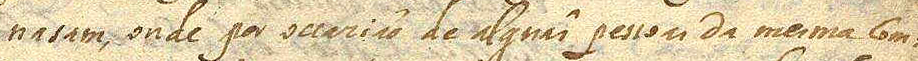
nasam, onde por occazião de alguâs pessoas da mesma com
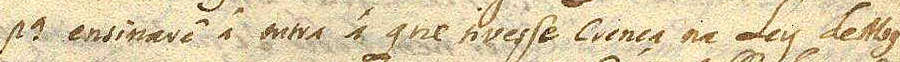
p.a ensinarē â outra â que tivesse crença na Ley de Moy
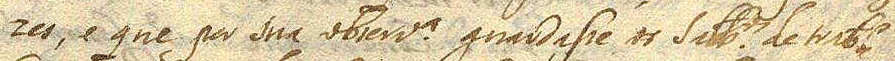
zes, e que por sua observ.a guardasse os Sabb.os de trab̄.o
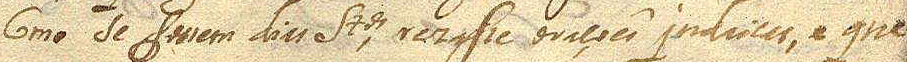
Como Se fossem dias Stos, rezasse orações judaicas, e que
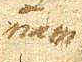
nam
